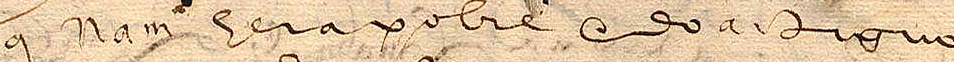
q̄ nam hera pobre e do artiguo
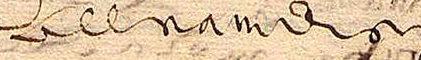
all nam dise
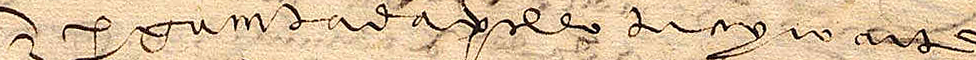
item ꝑgumtada pello terceyro arto
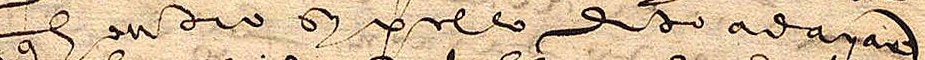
q̄ houtrosy pello dito adayão
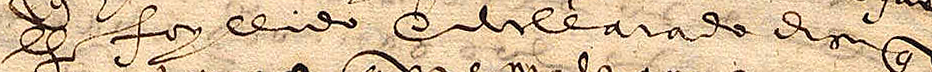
lhe foy llido e decllarado dise q̄
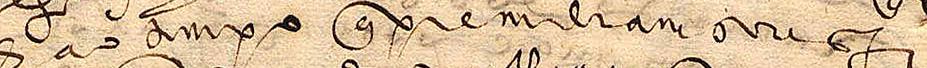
hao tempo q̄ premeram seus Jr
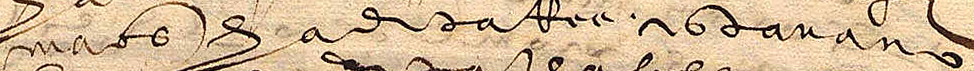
maõs ha dita Ree estaua no
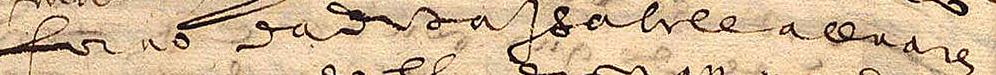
forno da dita Jsabell alluarez
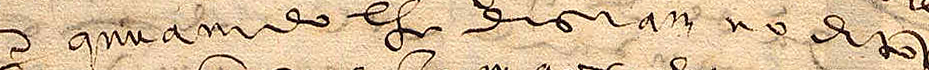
e quuamdo lhe diseram no dito
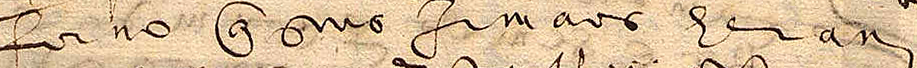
forno q̄ seus Jrmaos heram
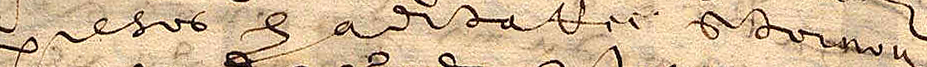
presos ha dita Ree se tornou
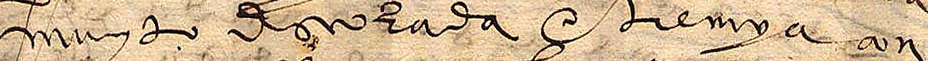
muyto descorada e tremya com
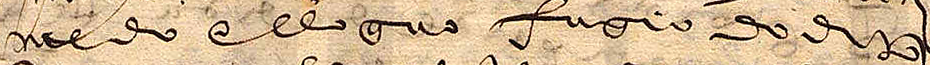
medo e lloguo fugio do dito
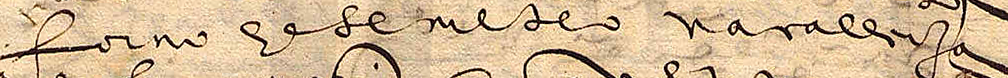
forno he se meteo na calleiJa
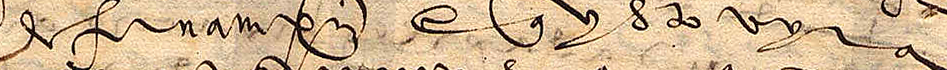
de fernam p̄iz e q̄ ysto vyra
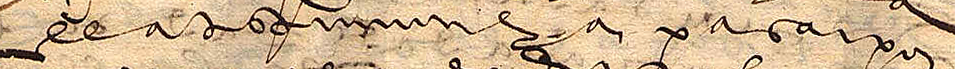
ella testemunha pasar por
